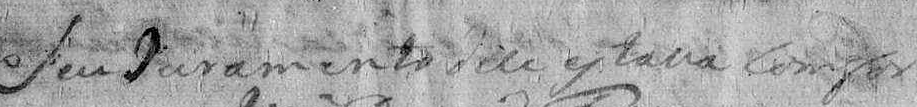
seu Iuramento dice estava Comfor
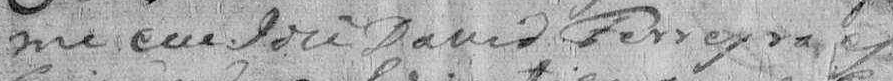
me e eu Iozé Dauid Ferreyra es
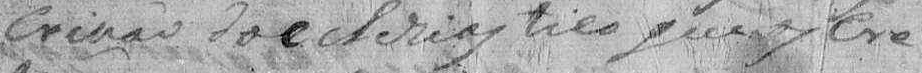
Crivaõ do ecleziastico que esCre
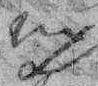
vy
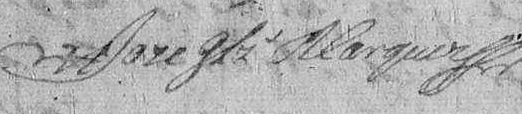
Joze Glz̄ Marquez
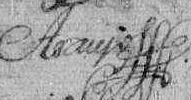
Araujo
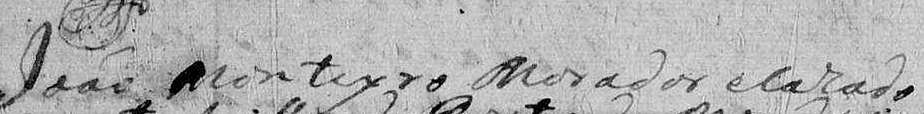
Joaõ Monteyro morador e cazado
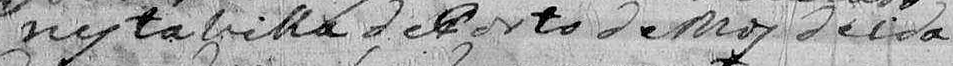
nesta villa de Porto de Mos de ida
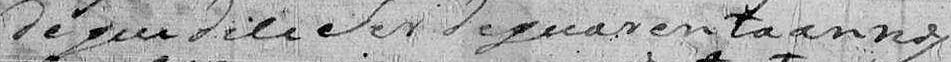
de que dice ser de quarenta annos
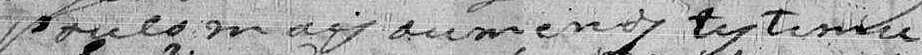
pouco mais ou menos testemu
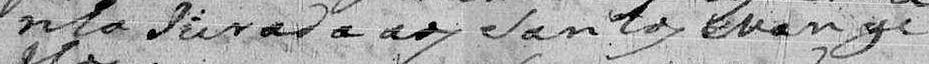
nha Iurada aos Santos Evange
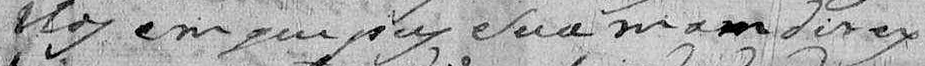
lhos em que pus sua mam direy
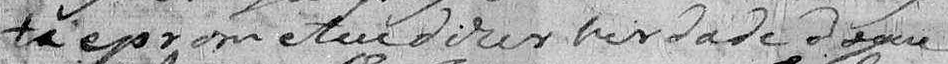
ta e prometeu dizer verdade do que
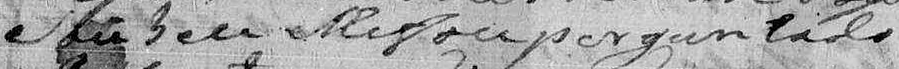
soubece e lhe foce perguntado
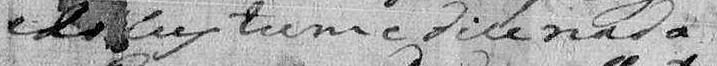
e do custume dice nada
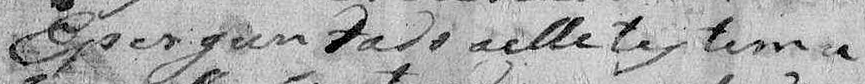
E perguntado a elle testemu
